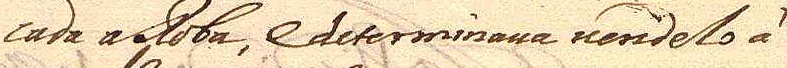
cada aRoba, e determinaua uendelo à
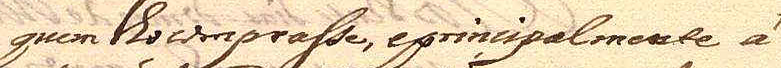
quem lho comprasse, e prinçipalmente à
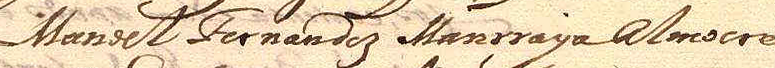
Manoel Fernandez Manrraya Almocre
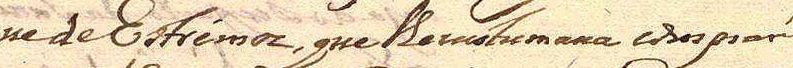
ue de Estrémoz, que lhe custumaua comprar
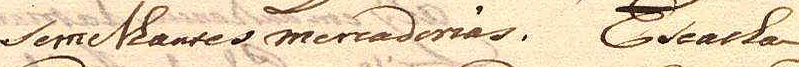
semelhantes mercadorias. E se acha
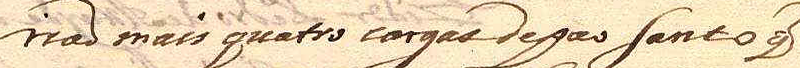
riaõ mais quatro cargas de pao santo q̄
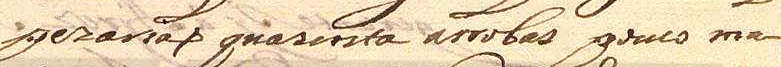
pezariaõ quarenta arrobas pouco ma
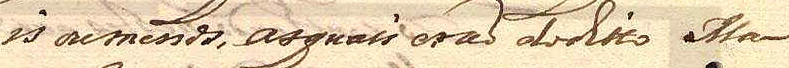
is ou menos, as quais eraõ do ditto Ma
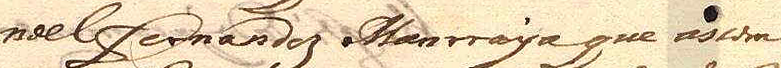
noel fernandez Manrraya que as com
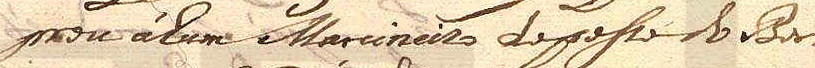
prou á hum Marcineiro do posso do Bor
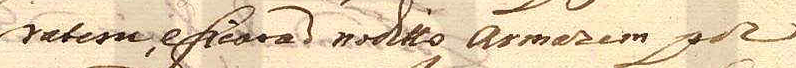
ratem, e ficaraõ no ditto armazem por
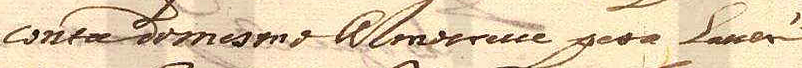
conta do mesmo Almocreue pera hauerē
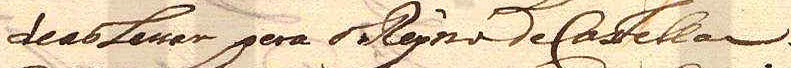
de as Leuar pera o Reyno de Castella
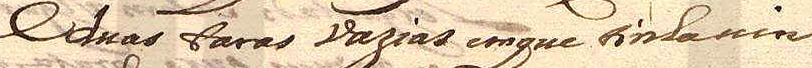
E duas taras vazias con que tinha uin
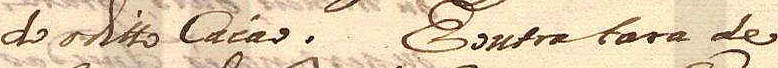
do o ditto Cacáo. E outra tara de
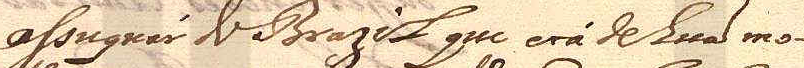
assuquar do Brazil que era de huā mo
